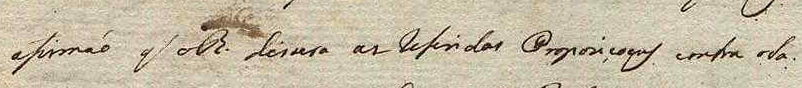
afirmaõ q̄ o R. dissera as Referidas Propoziçoens contra o Sa
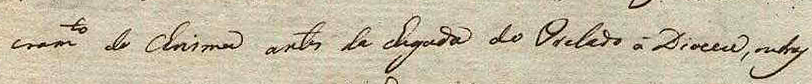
cram.to do Chrisma antes da chegada do Prelado á Dioceze, outras
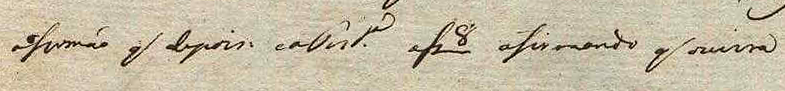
afirmaõ q̄ depois e a Test.a a f8 afirmando q̄ ouvira
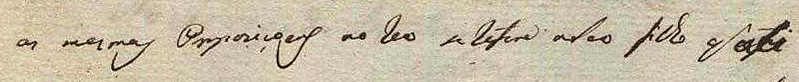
as mesmas Propoziçoes ao Reo se Refere a seo filho q̄ ali
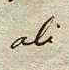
ali
